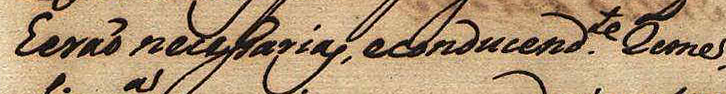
heraõ necessarias, e conducend.te Reme
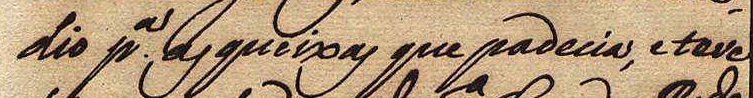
dio p.a as queixas que padecia, e teve
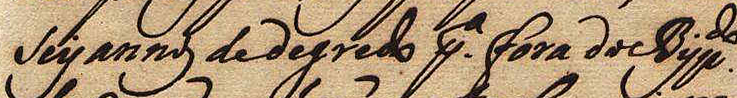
seis annos de degredo p.a fora do Bisp.do
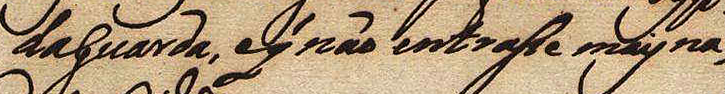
da Guarda, e q̄ naõ entrasse mais na
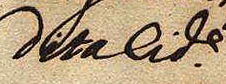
dita Cid.e
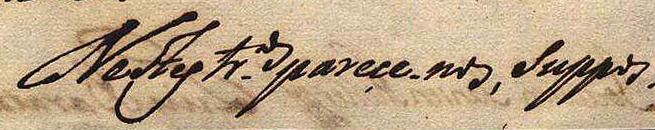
Nestes tr.os parece-nos, suppos.
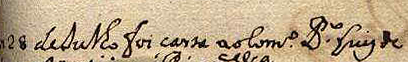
28 de Iulho foi carta ao Com.o P.o Luis de
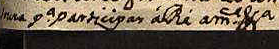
ra p.a participar á Ré a m.ce &a
